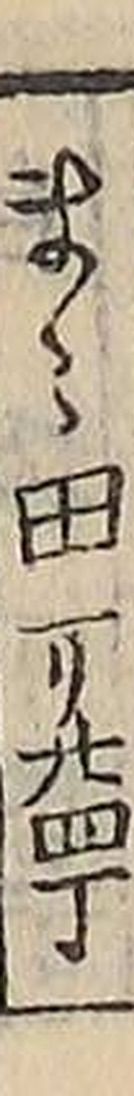まゝ田一リ廿四丁
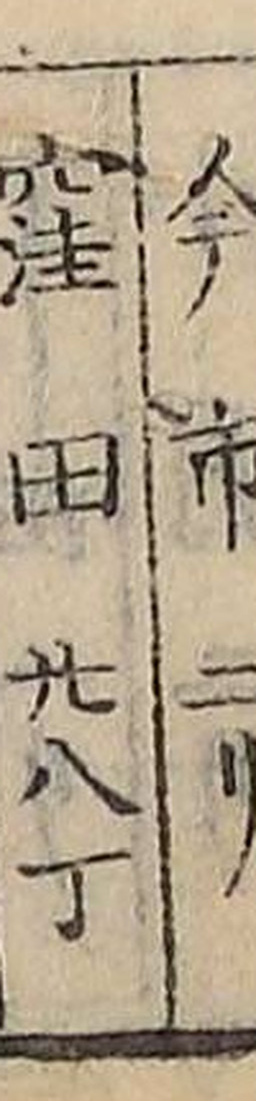窪田廿八丁
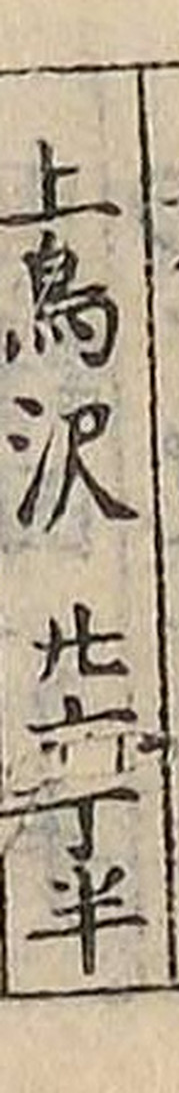上鳥沢廿六丁半
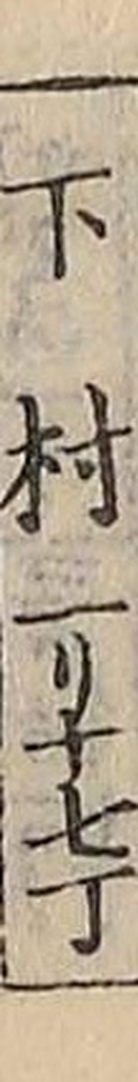下村一リ十七丁
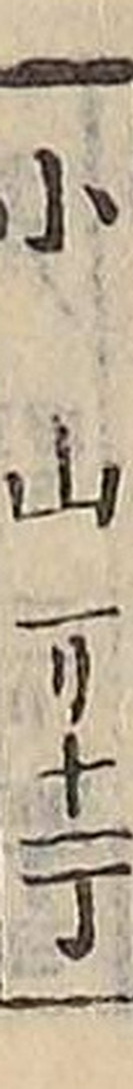小山一リ十一丁
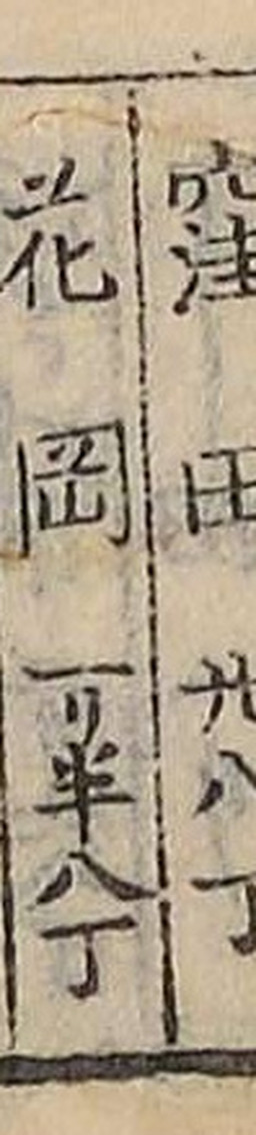花岡一リ半八丁
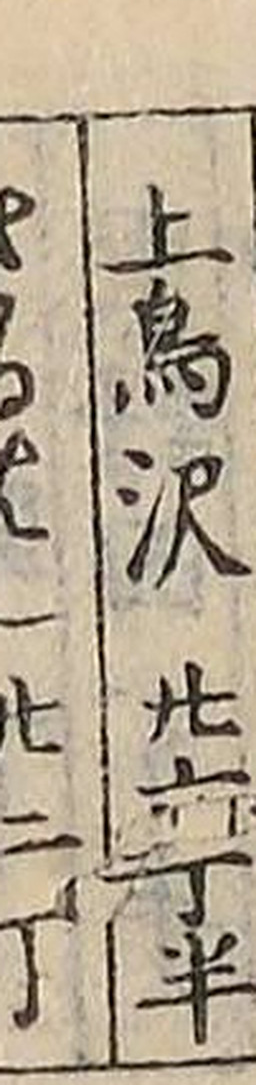さるはし廿二丁
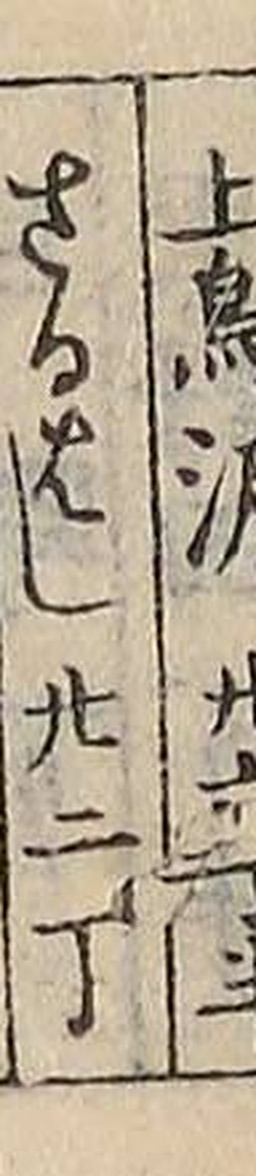さるはし廿二丁
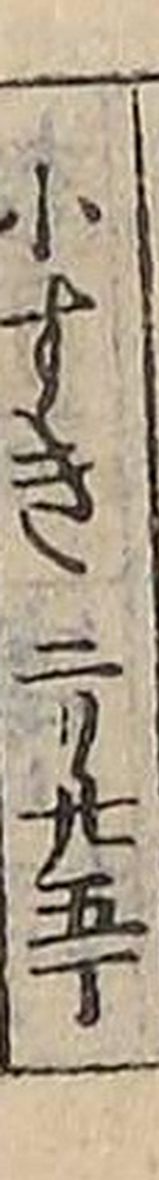小すき二リ廿五丁
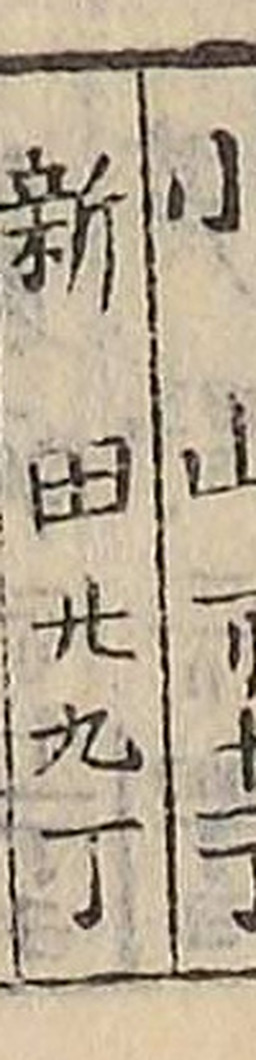新田廿九丁
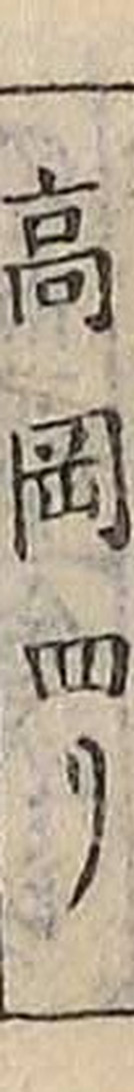高岡四リ
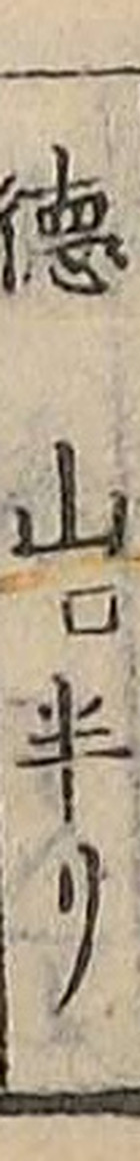徳山▫半リ
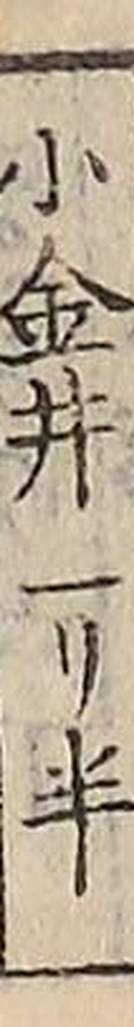小金井一リ半
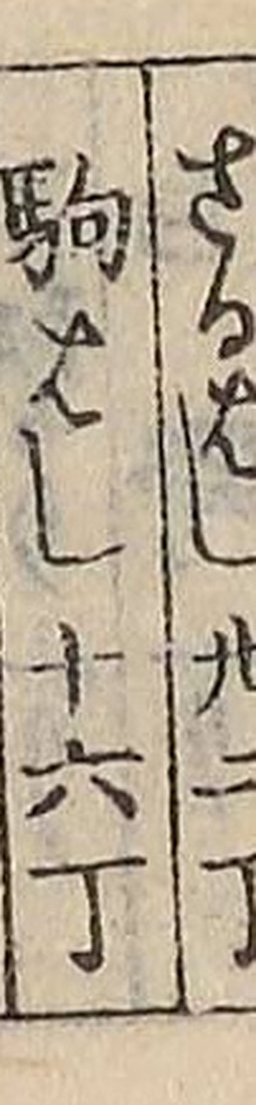駒はし十六丁
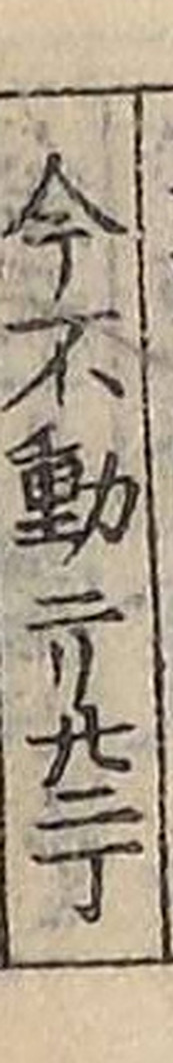今不動二リ廿二丁
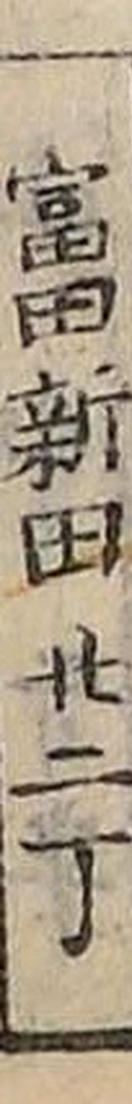富田新田廿二丁
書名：旅行用心集
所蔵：神戸大学附属図書館 国文学研究資料館
